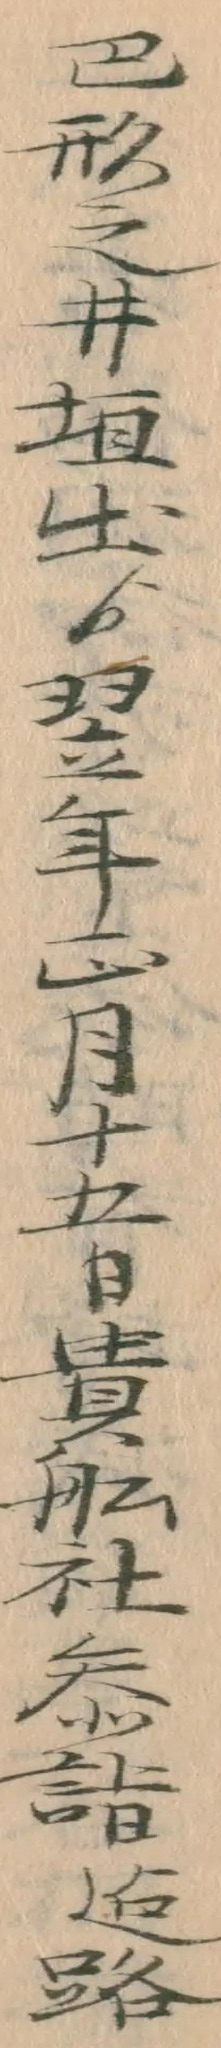巴形之井垣出ゟ翌年正月十五日貴船社参詣迄路
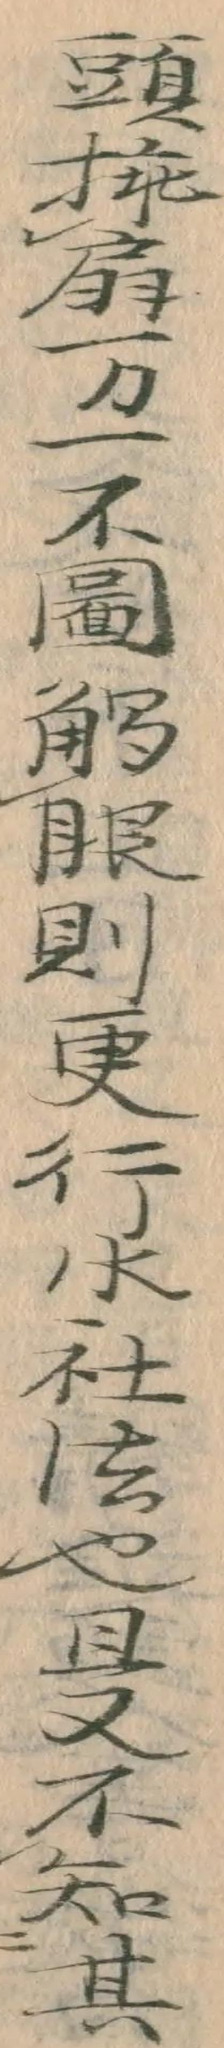頭挿扇万一不圖触眼則更行水社法也且又不知其
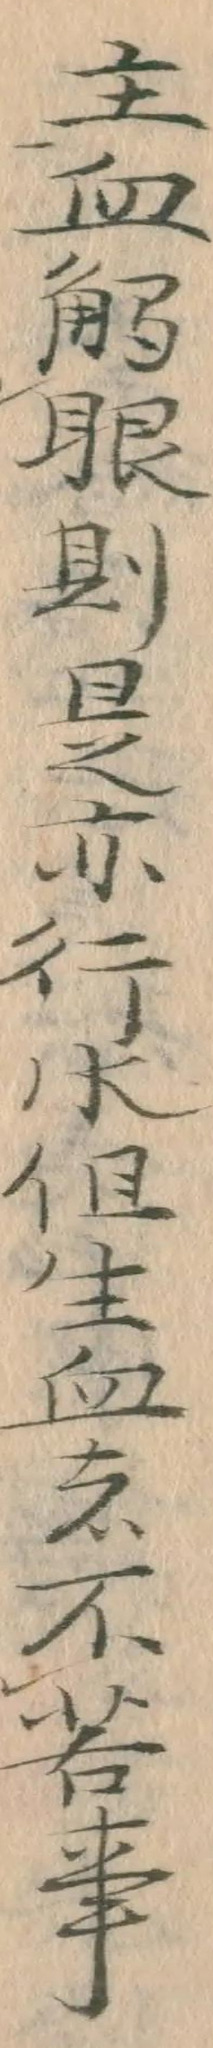主血解眼則是亦行水但生血者不苦答事
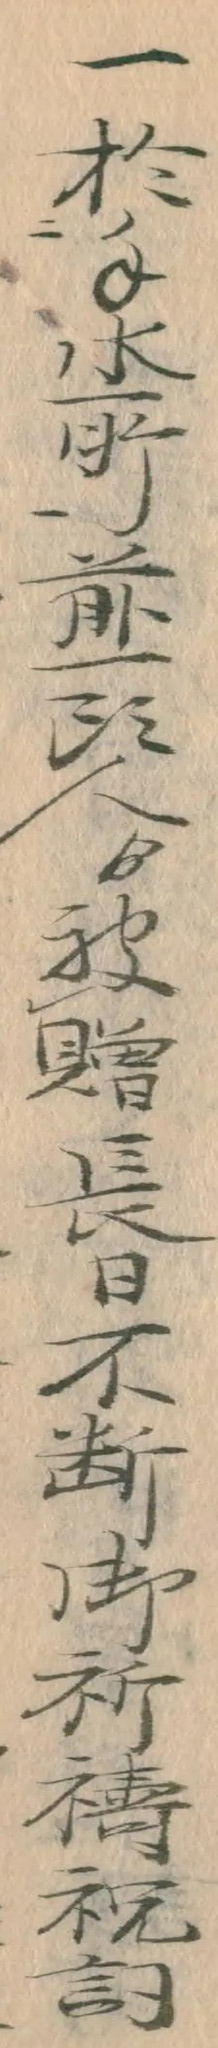一於手水所前一頭人ゟ被贈長日不断御祈祷祝詞
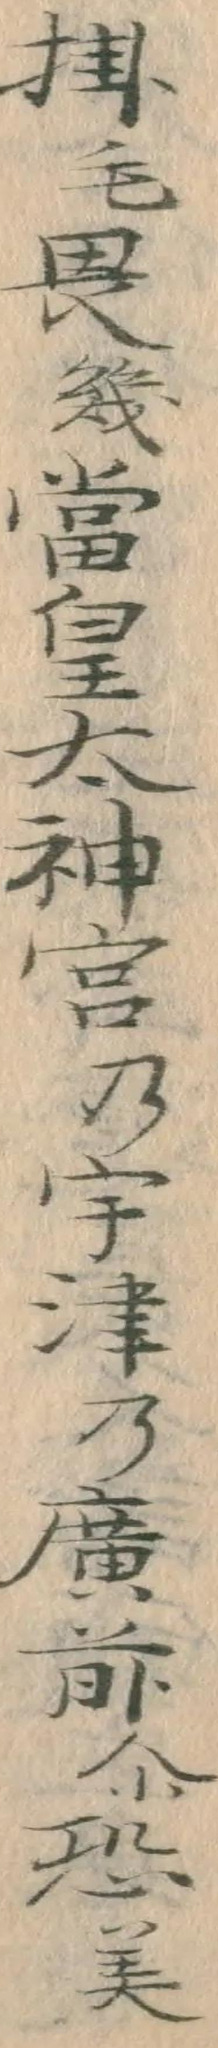掛毛畏幾當皇太神宮乃宇津乃廣前尒恐美
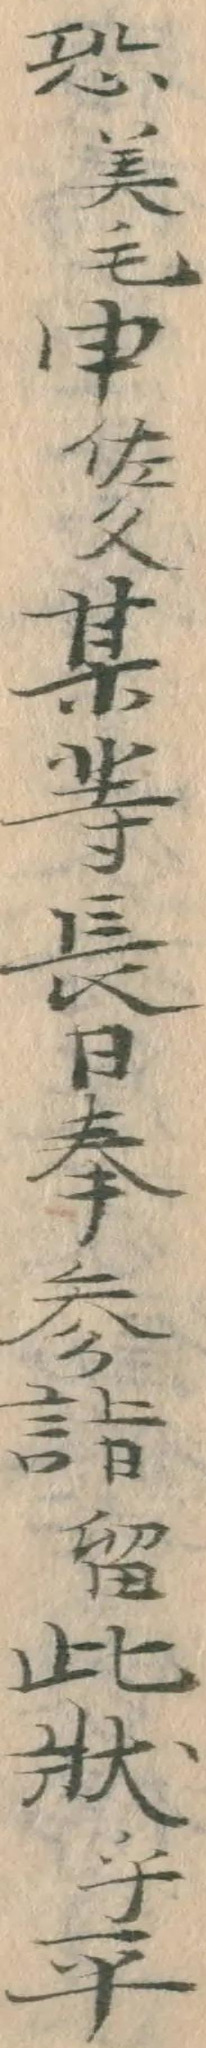恐美毛申佐久某等長日奉参詣留此状乎平
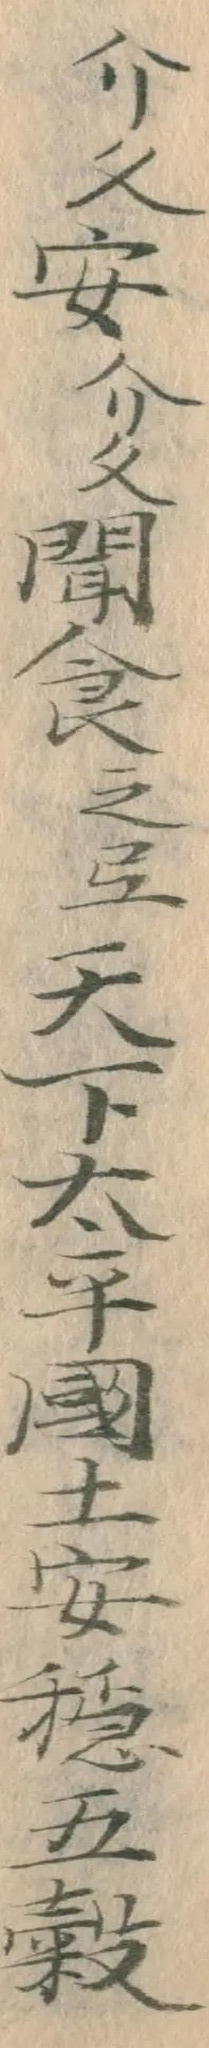介久安介久聞食之弖天下太平國土安穏五穀
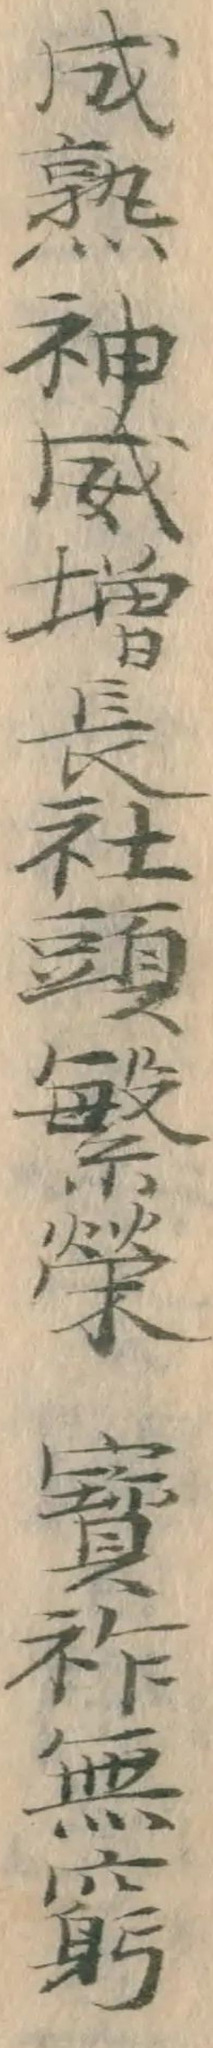成熟神威増長社頭繁栄寶祚無窮

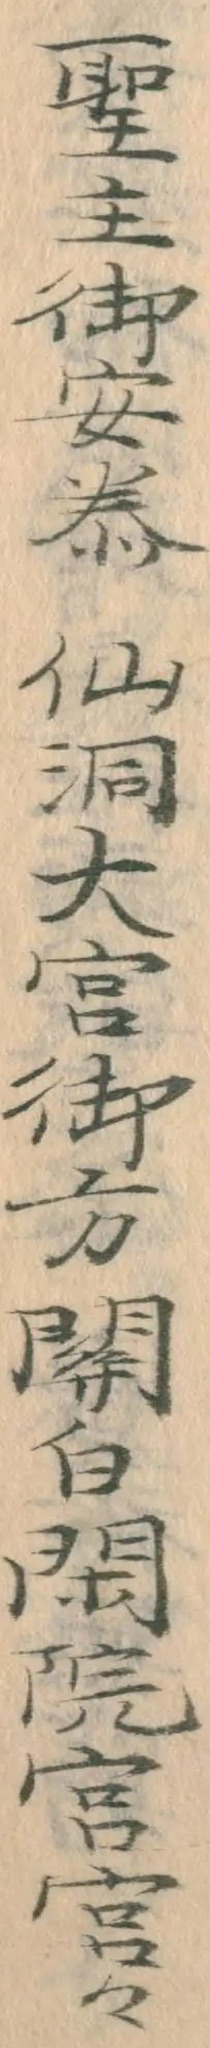聖主御安泰仙洞大宮御方関白閑院宮宮々
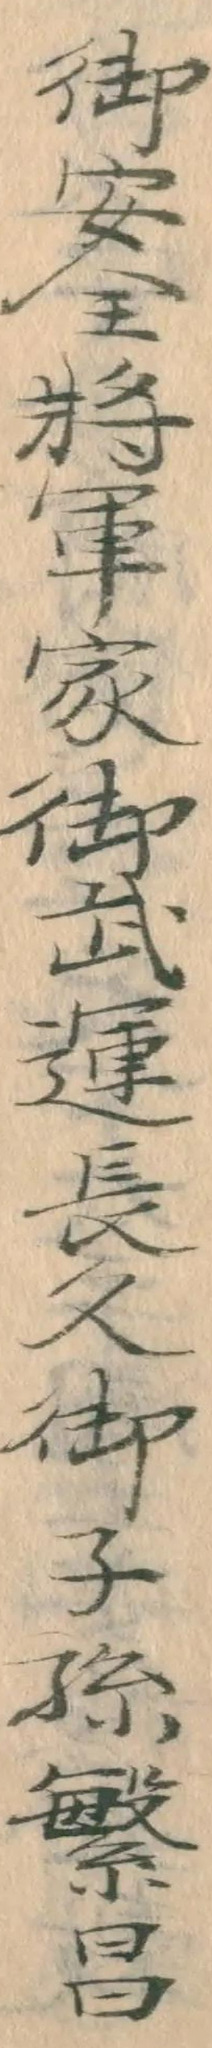御安全将軍家御武運長久御子孫繁昌
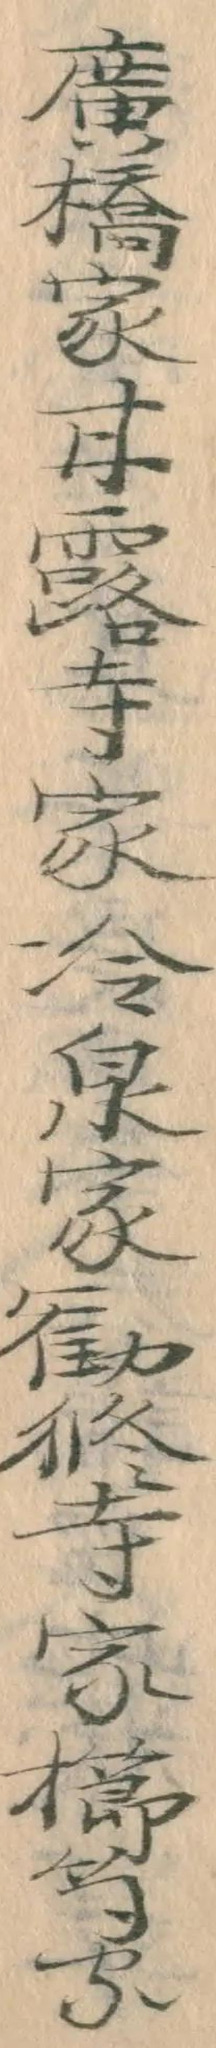廣橋家甘露寺家冷泉家勧修寺家櫛笥家
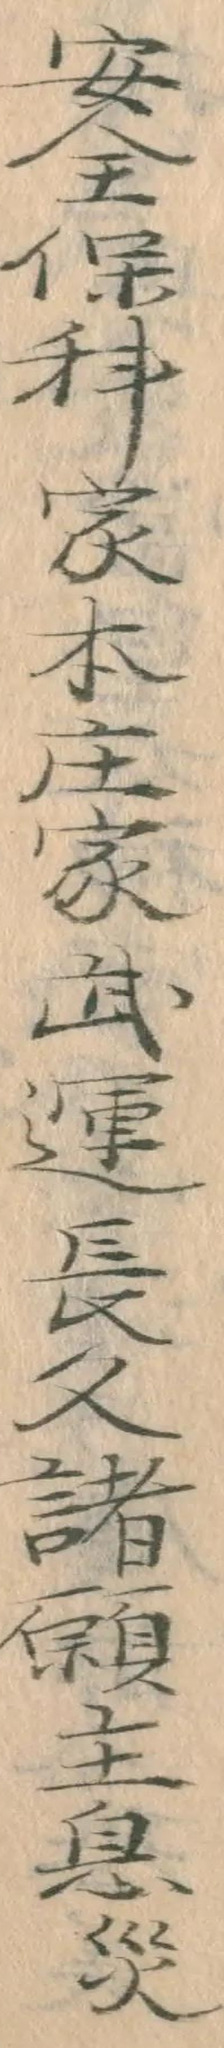安全保科家本庄家武運長久諸願主息災
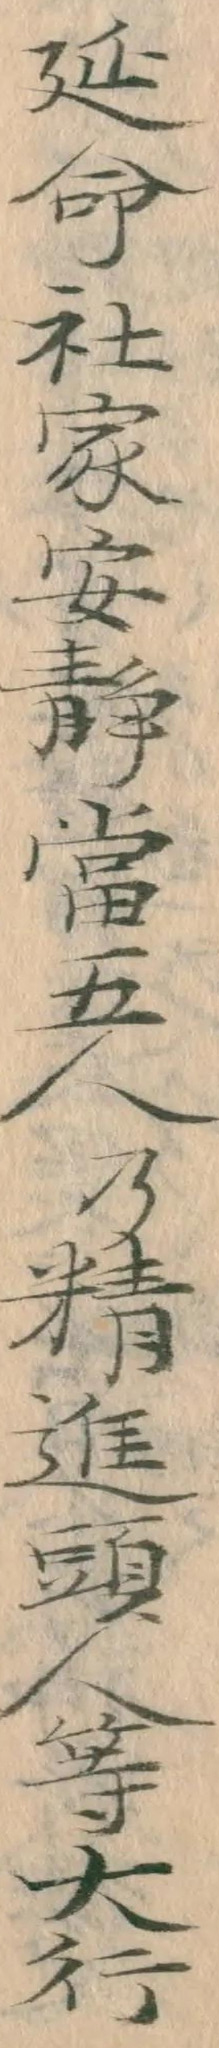延命社家安静當五人乃精進頭等大行
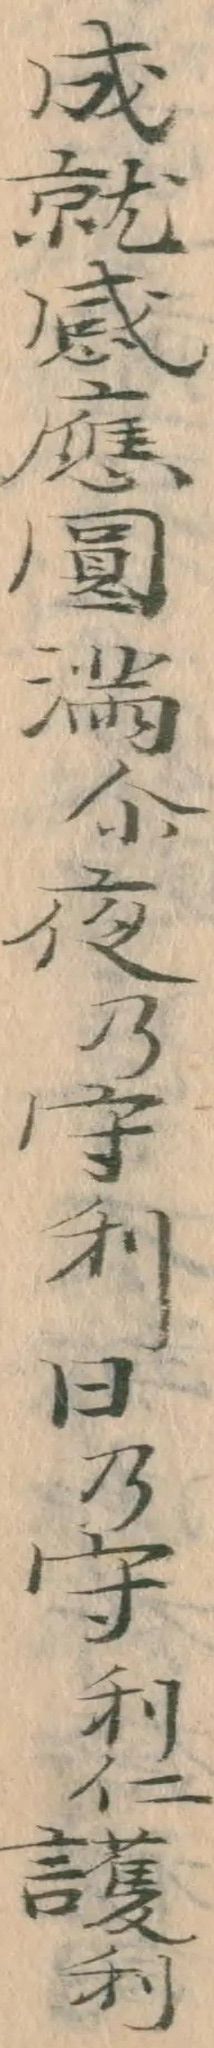成就感應圓満尒夜乃守利日乃守利仁護利
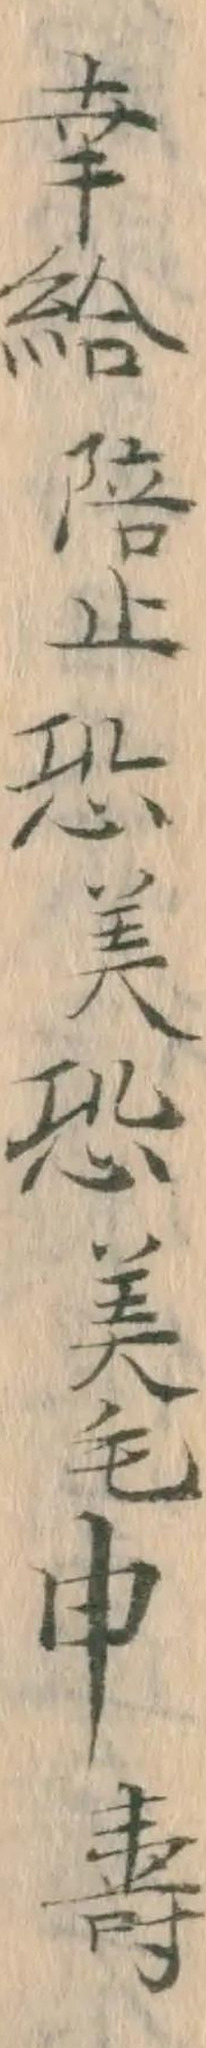幸給陪止恐美恐美毛申壽
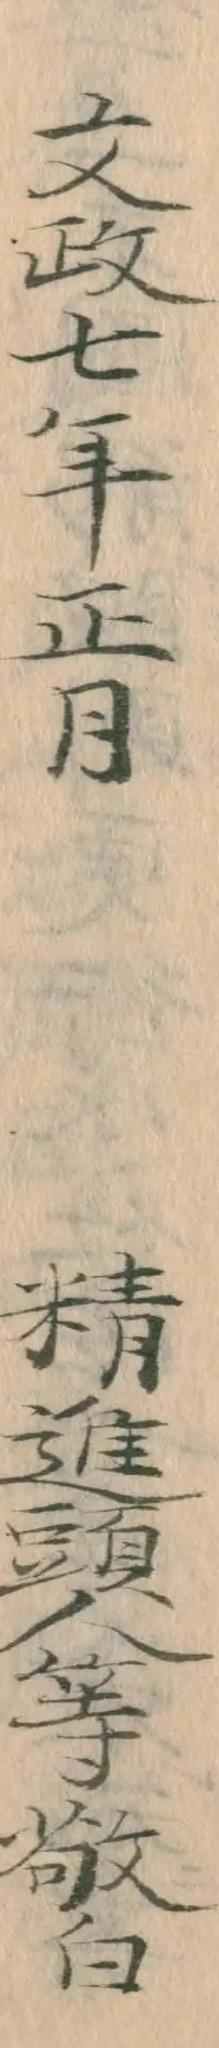文政七年正月精進頭人等敬白
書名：賀茂社記録. 第72冊
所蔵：国立国会図書館 National Diet Library, JAPAN
